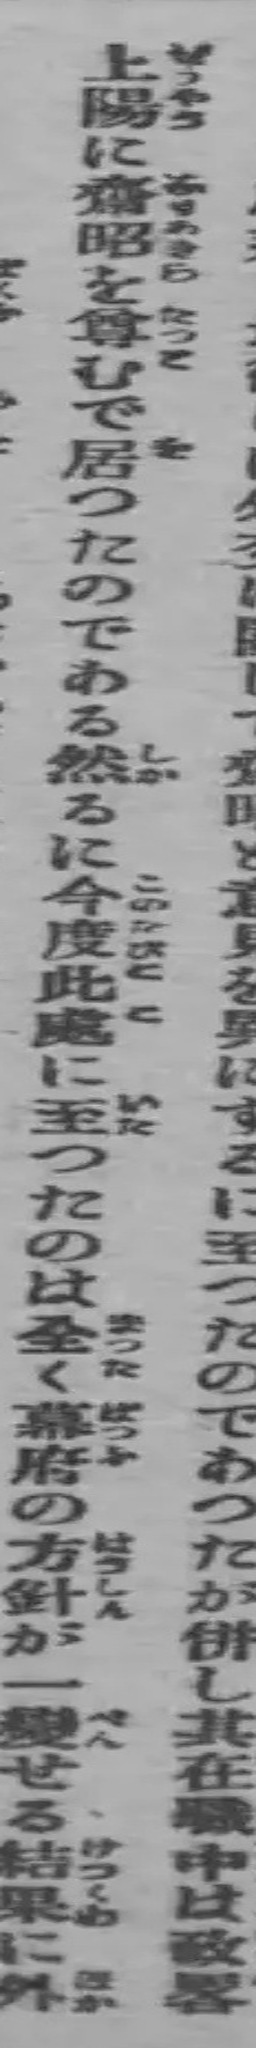上陽に斉昭を尊むで居つたのである然るに今度此処に至つたのは全く幕府の方針が一変せる結果に外
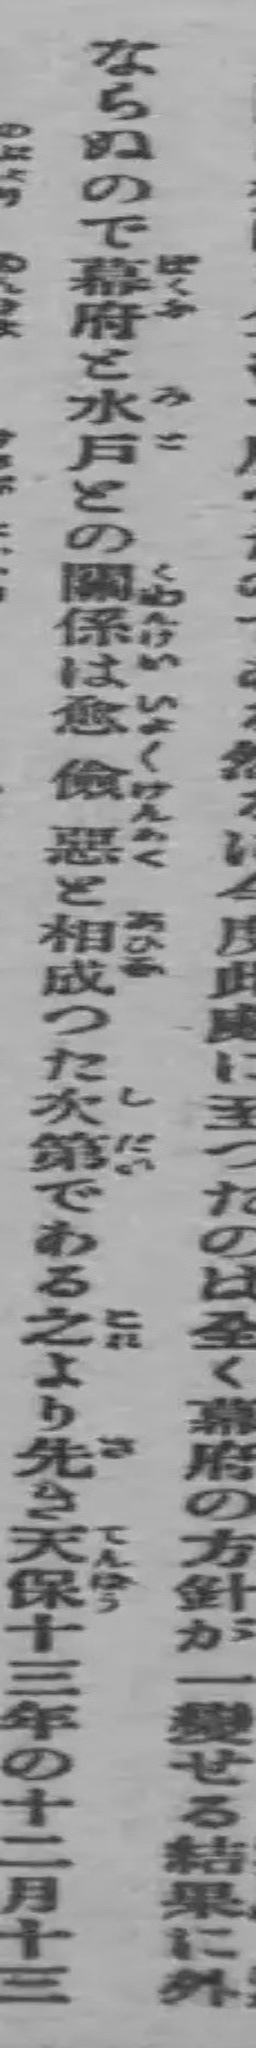信順の隠居ならぬので幕府と水戸との関係は愈険悪と相成つた次第である之より先き天保十三年の十二月十三
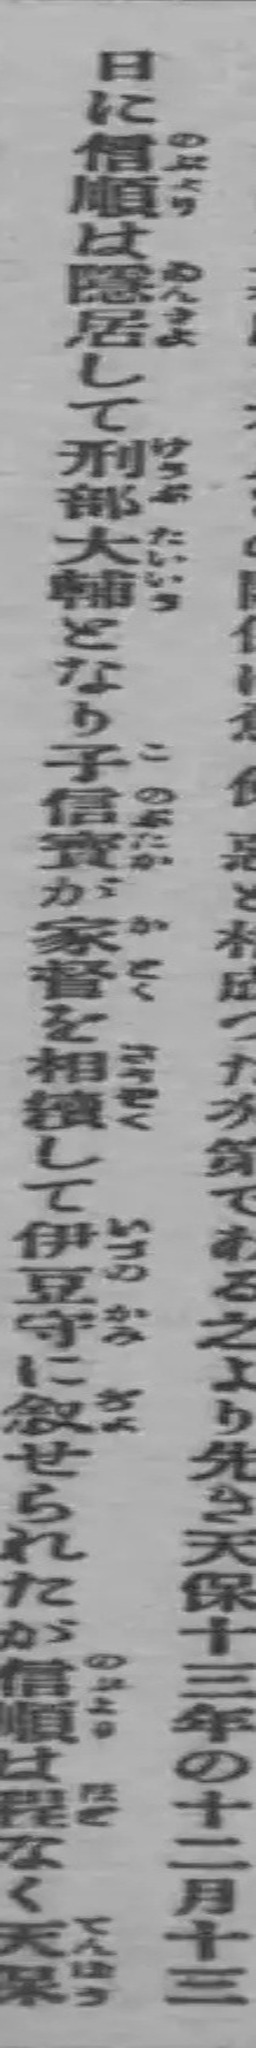日に信順は隠居して刑部大輔となり子信賓が家督を相続して伊豆守に叙せられたが信順は程なく天保
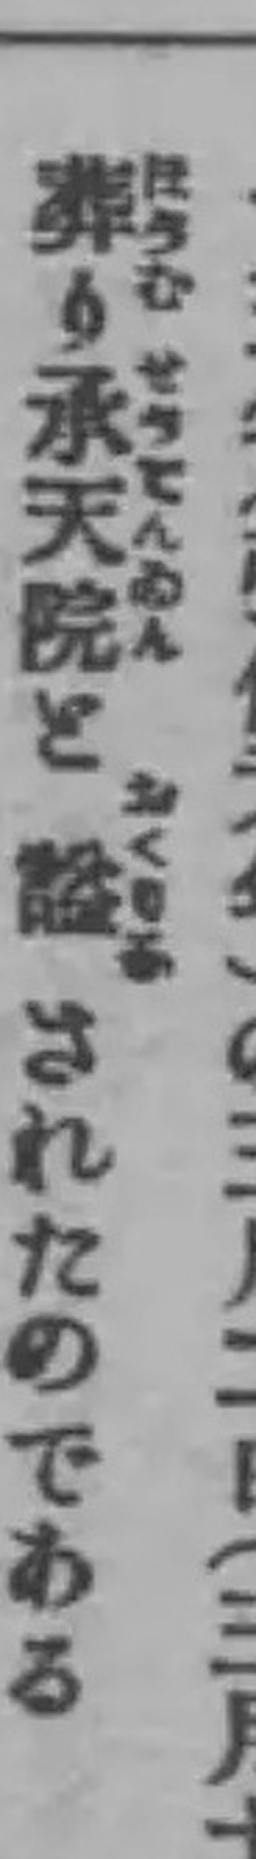葬り承天院と諡されたのである
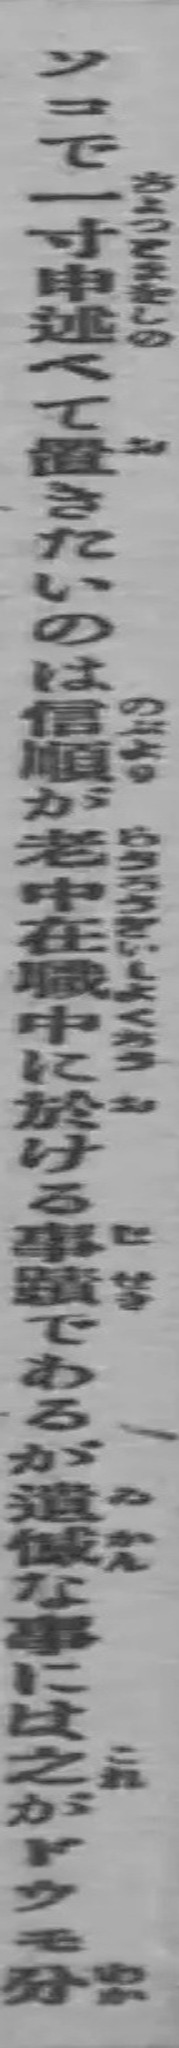ソコで一寸申述べて置きたいのは信順が老中在職中に於ける事蹟であるが遺憾な事には之がドウモ分
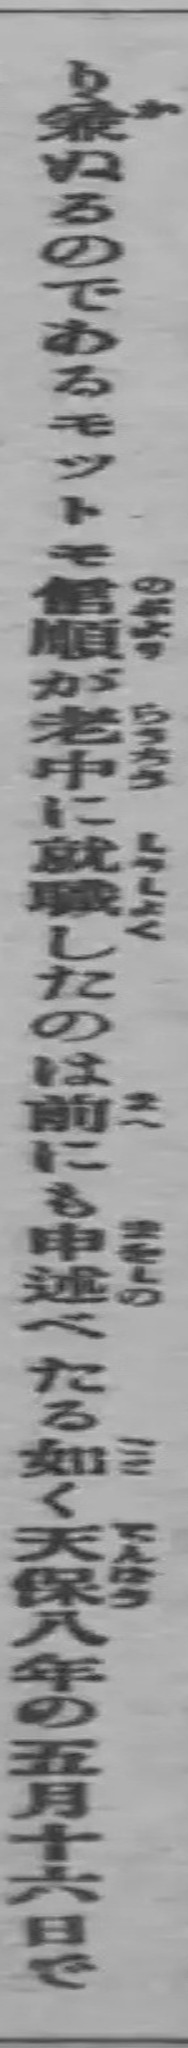り兼ぬるのであるモツトモ信順が老中に就職したのは前にも申述べたる如く天保八年の五月十六日で
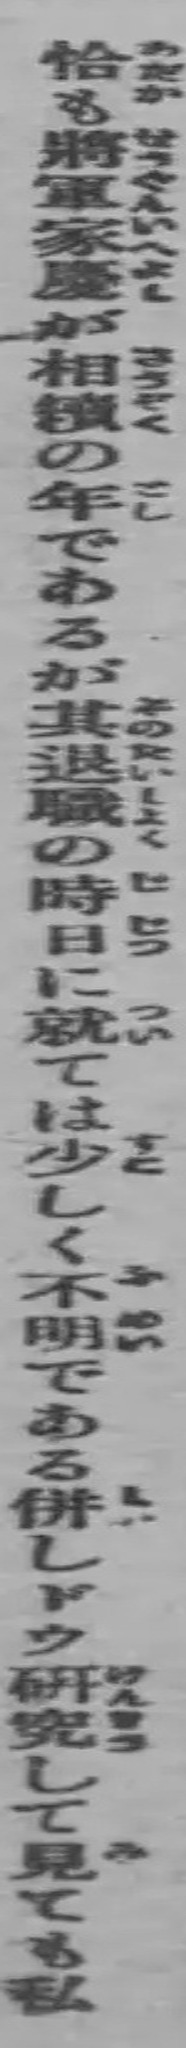恰も将軍家慶が相続の年であるが其退職の時日に就ては少しく不明である併しドウ研究して見ても私
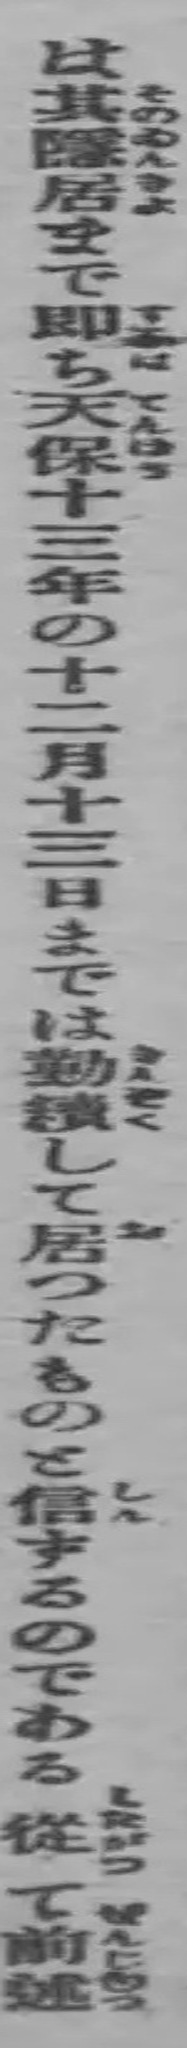は其隠居まで即ち天保十三年の十二月十三日までは勤続して居つたものと信ずるのである従て前述
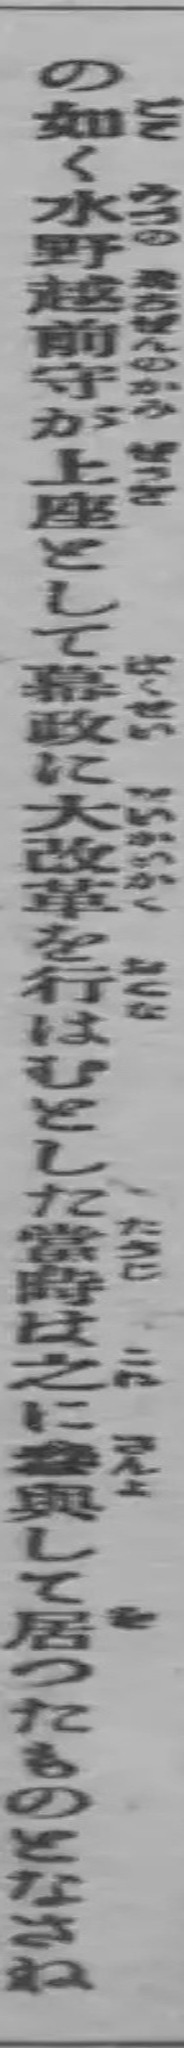の如く水野越前守が上座として幕政に大改革を行はむとした当時は之に参与して居つたものとなさね
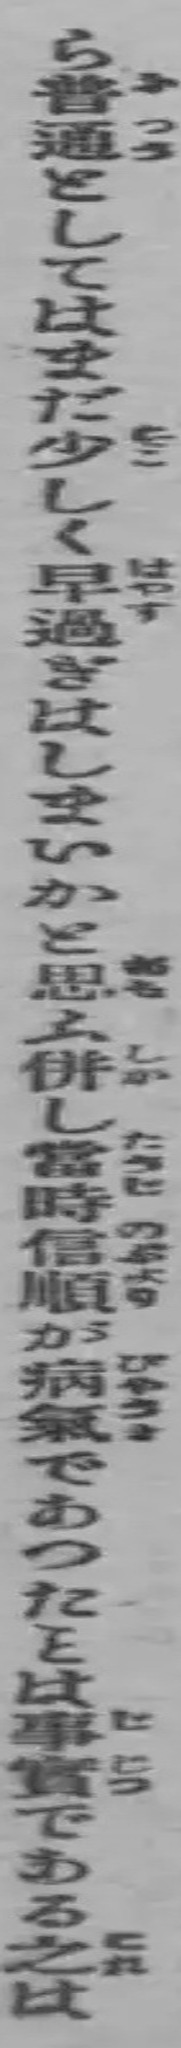ら普通としてはまだ少しく早過ぎはしまいかと思ふ併し当時信順が病気であつたことは事実である之は
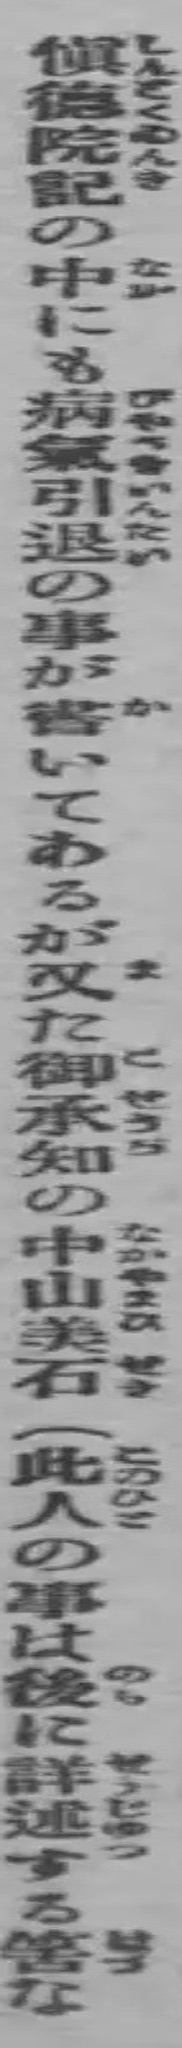慎徳院記の中にも病気引退の事が書いてあるが又た御承知の中山美石(此人の事は後に詳述する筈な
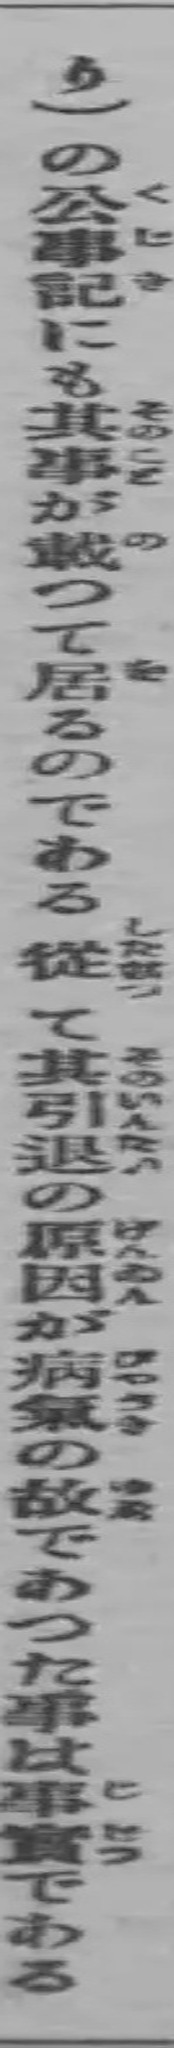り)の公事記にも其事が載つて居るのである従て其引退の原因が病気の故であつた事は事実である
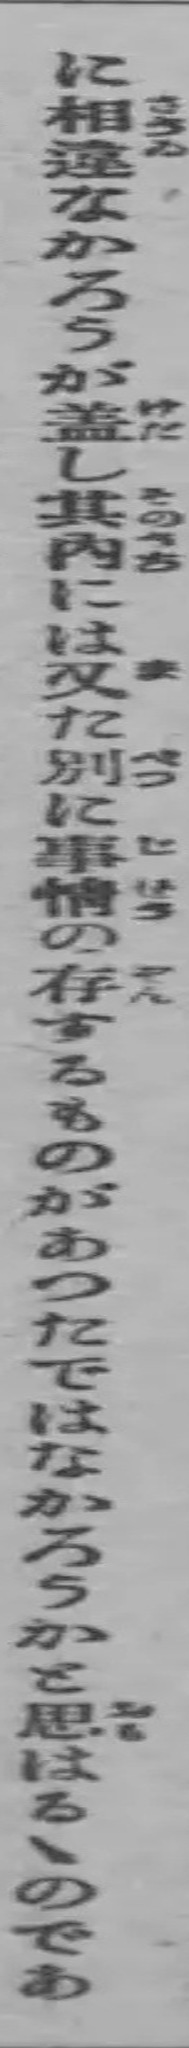に相違なかろうが蓋し其内に又た別に事情の存するものがあつたではなかろうかと思はるゝのであ
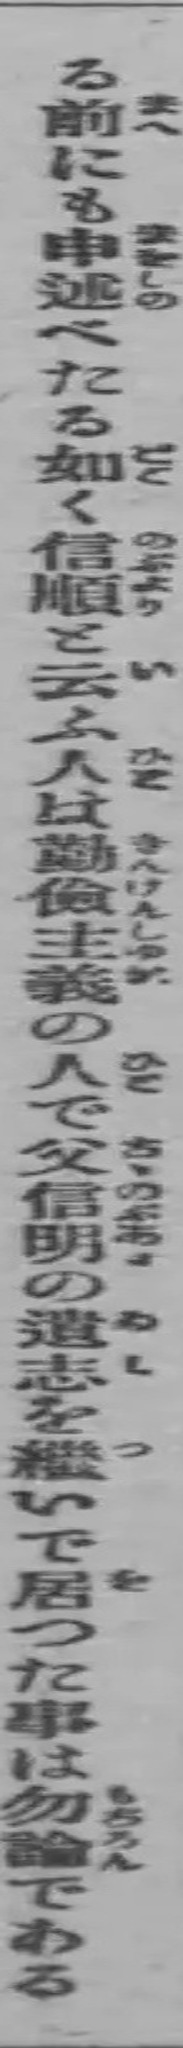る前にも申述べたる如く信順と云ふ人は勤倹主義の人で父信明の遺志を継いで居つた事は勿論である
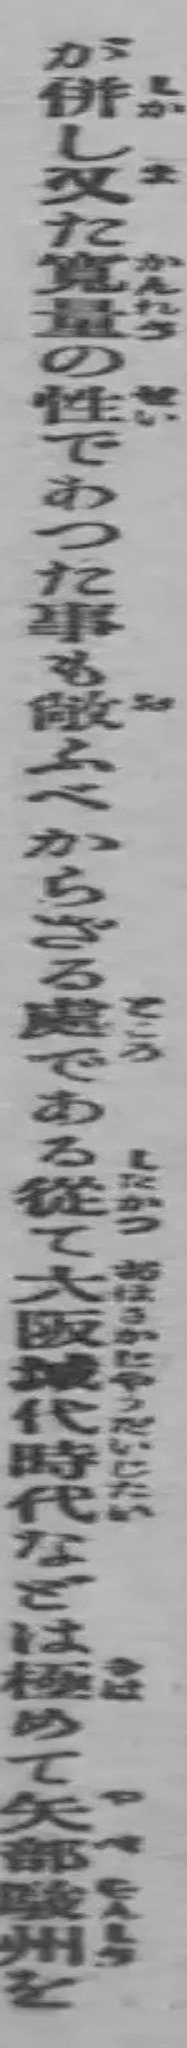が併し又た寛量の性であつた事も敞ふべからざる処である従て大阪城代時代などは極めて矢部駿州を
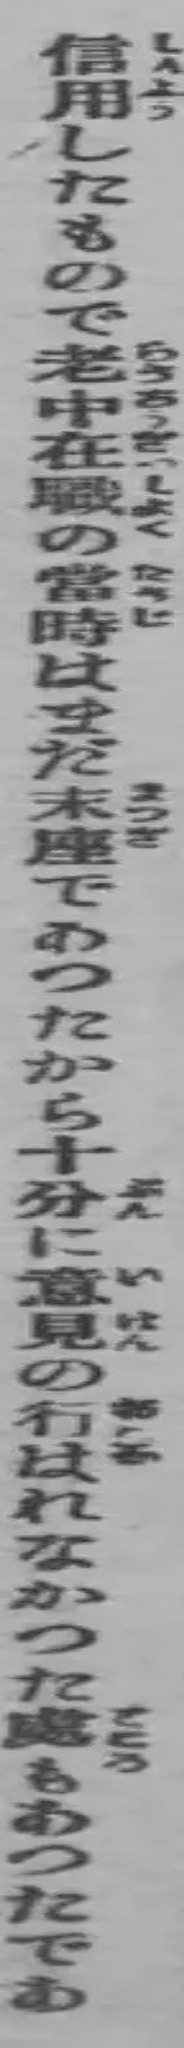信用したもので老中在職の当時はまだ末座であつたから十分に意見の行はれなかつた処もあつたであ
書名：豊橋市史談
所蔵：国立国会図書館 National Diet Library, JAPAN
